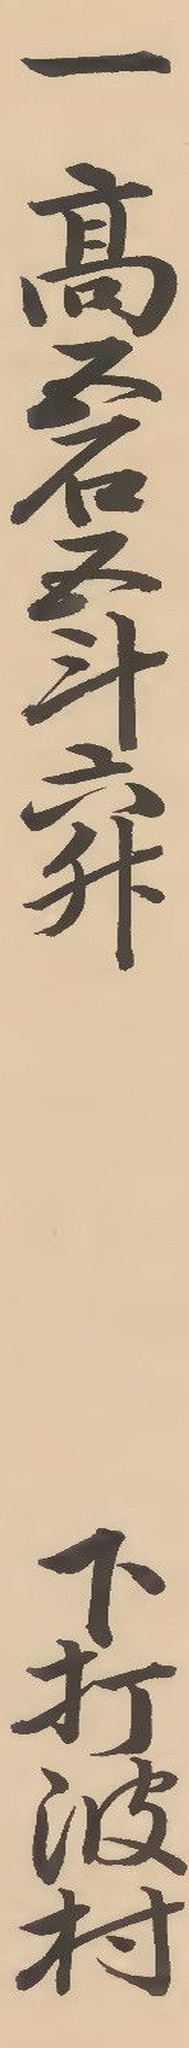一高五石五斗六升下打波村
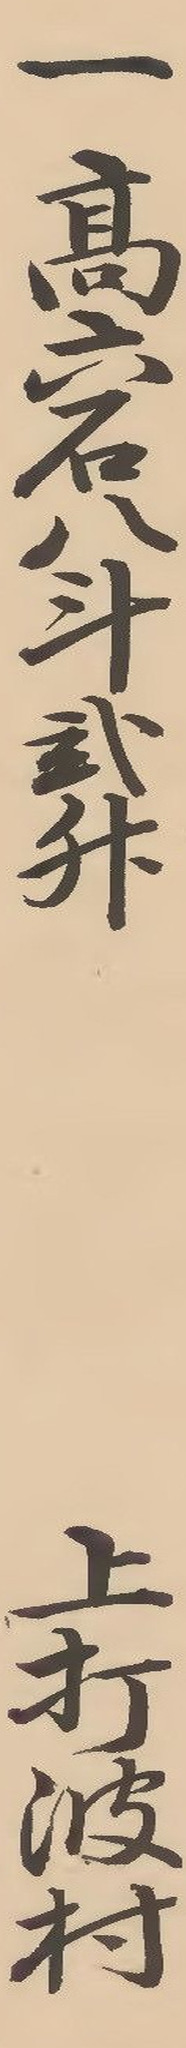一高六石八斗弐升上打波村
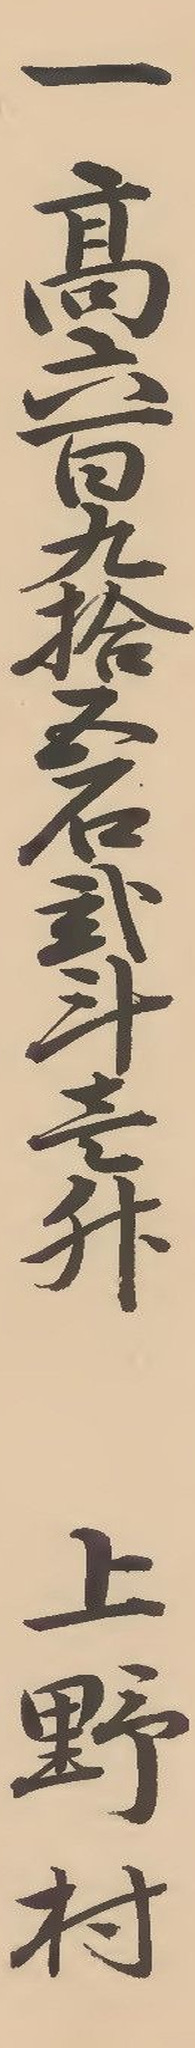一高六百九拾五石弐斗壱升上野村
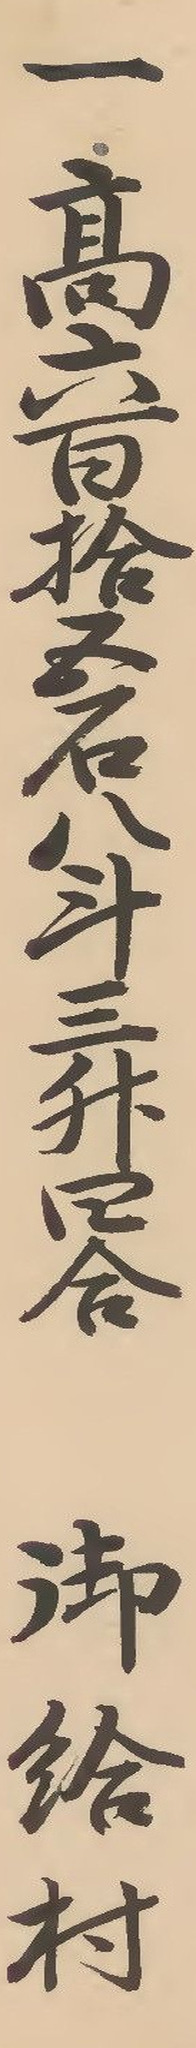一高六百拾五石八斗三升四合御給村

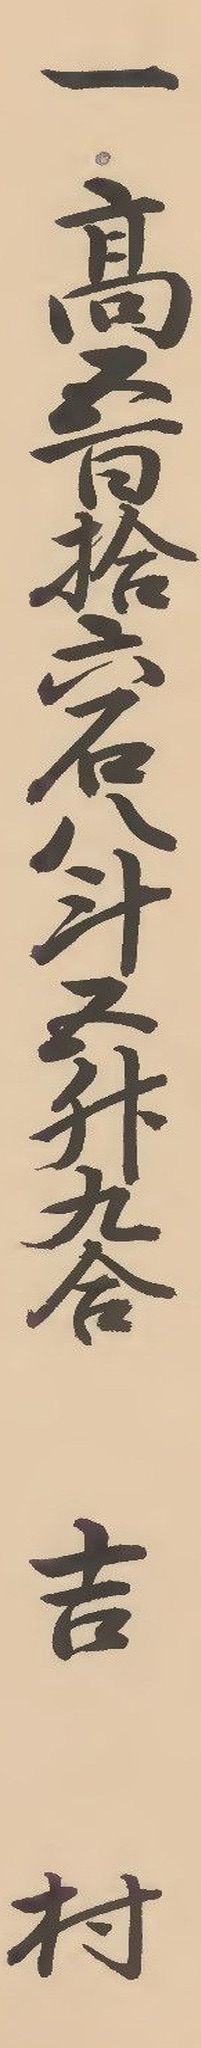一高五百拾六石八斗五升九合吉村
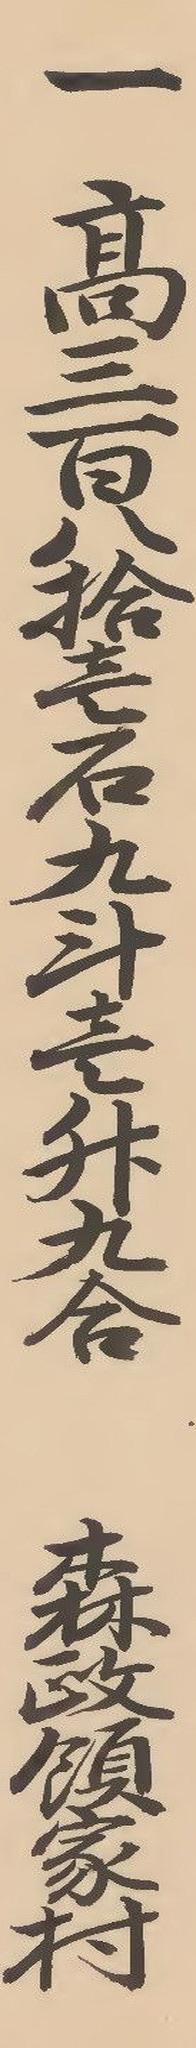一高三百八拾壱石九斗壱升九合森政領家村
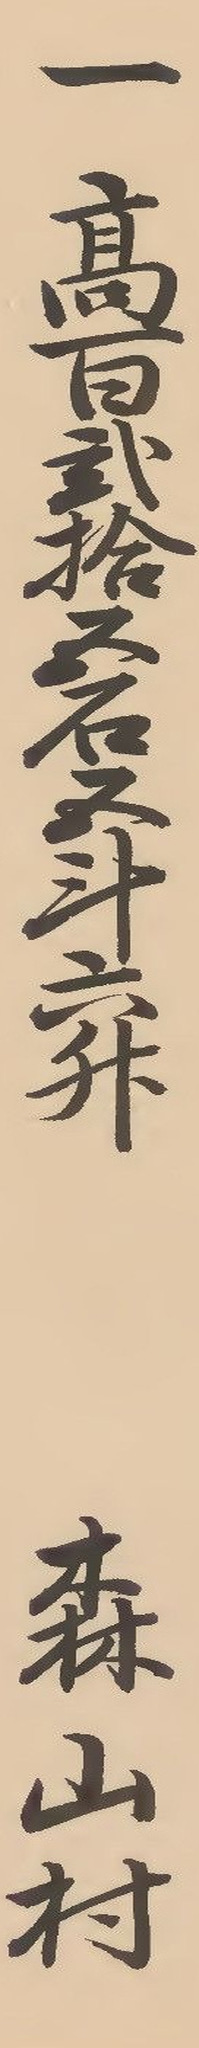一高百弐拾五石五斗六升森山村
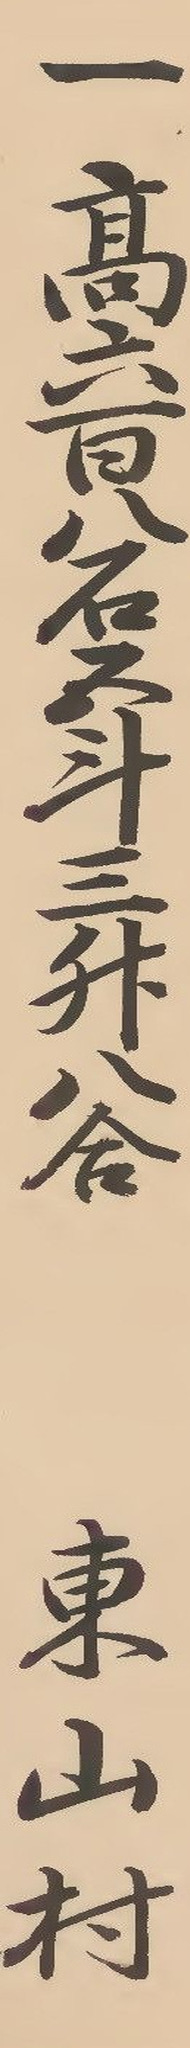一高六百八石五斗三升八合東山村
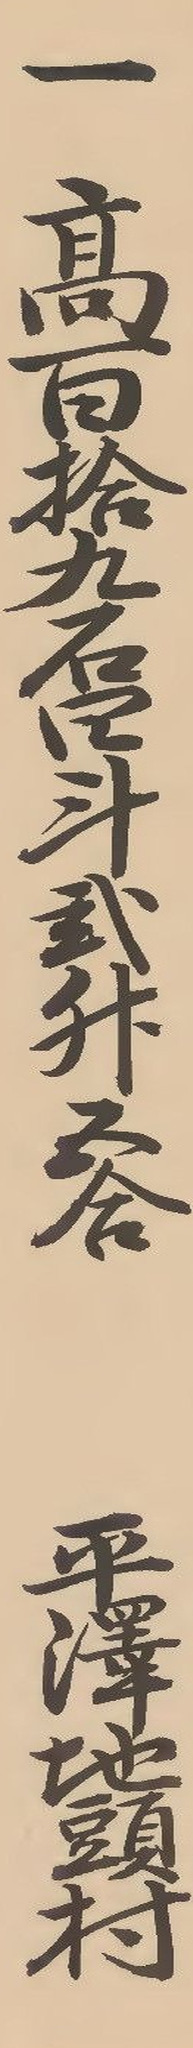一高百拾九石四斗弐升五合平沢地頭村
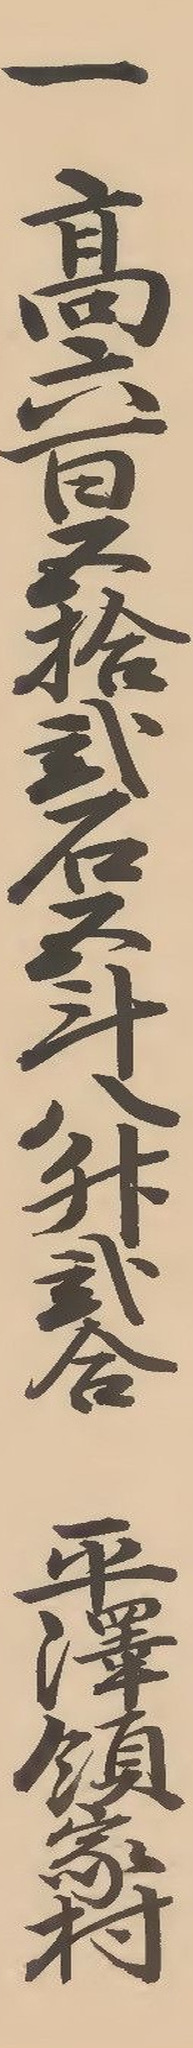一高六百五拾弐石五斗八升弐合平沢領家村
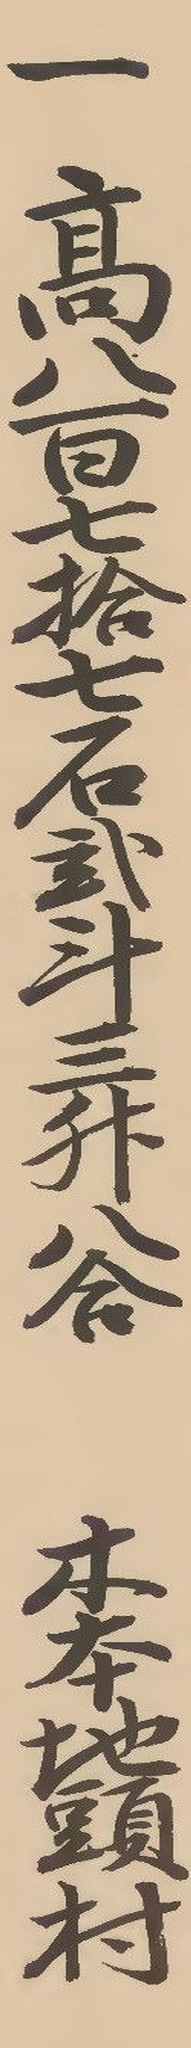一高八百七拾七石弐斗三升八合木本地頭村

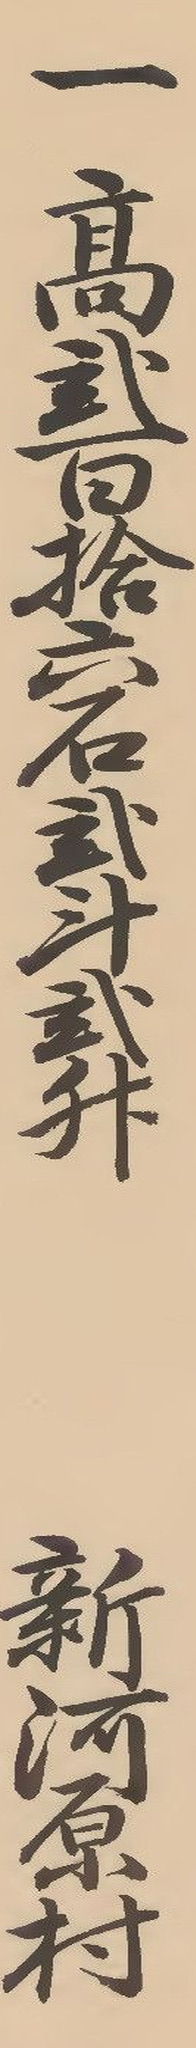一高弐百拾六石弐斗弐升新河原村
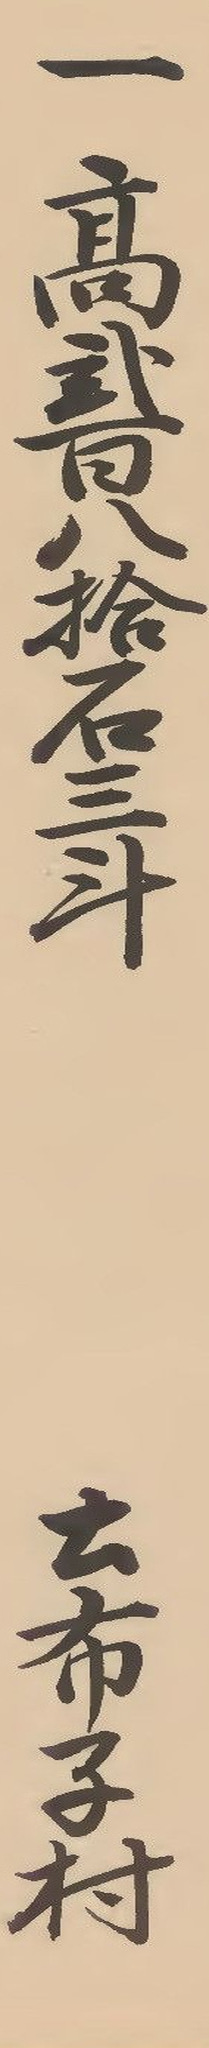一高弐百八拾石三斗土布子村
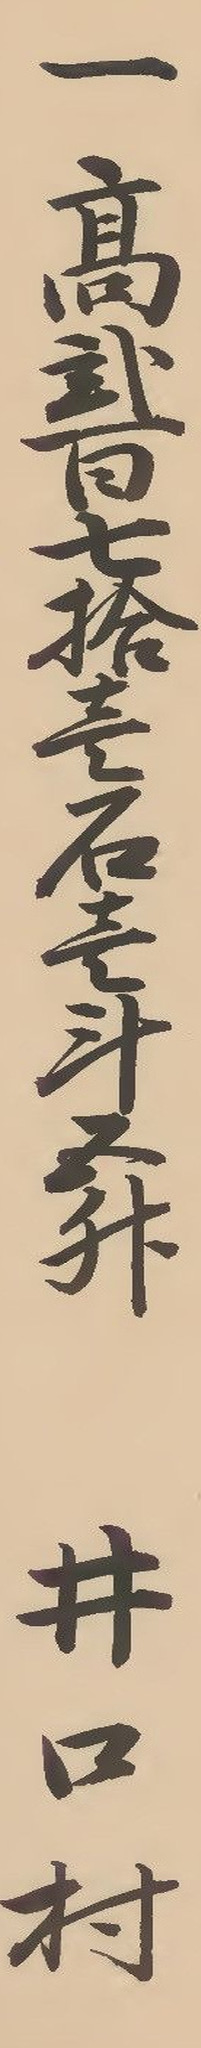一高弐百七拾壱石壱斗五升井口村
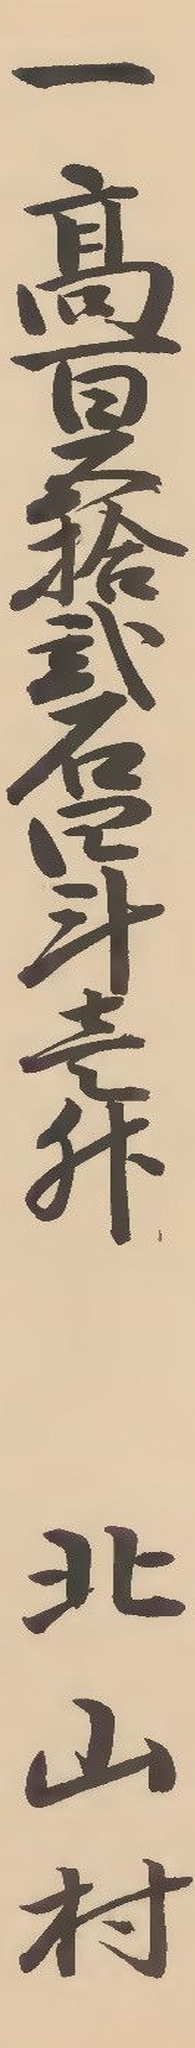一高百五拾弐石四斗壱升北山村
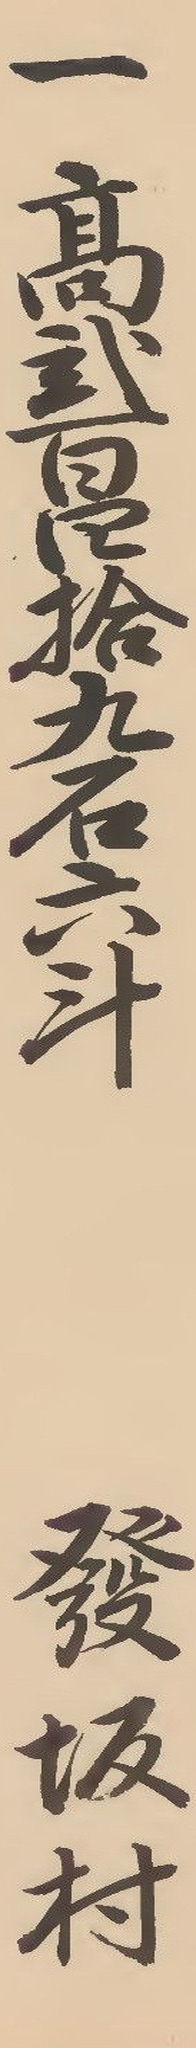一高弐百四拾九石六斗発坂村
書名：越前国郷帳
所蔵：国立公文書館 National Archives of Japan
